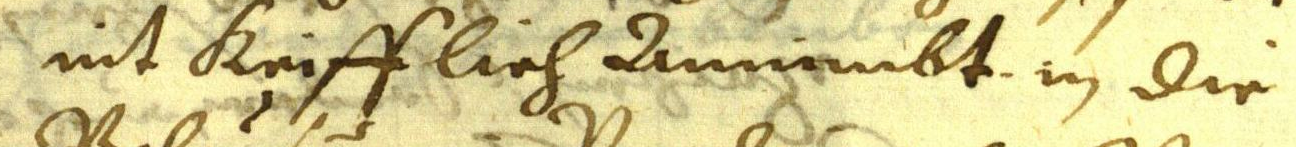nit keifflich Annimbt. in die
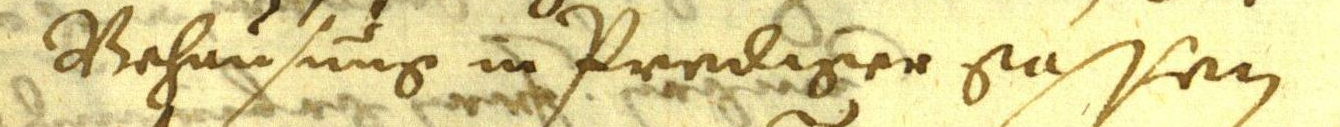Behaūsung in Prediger gassen
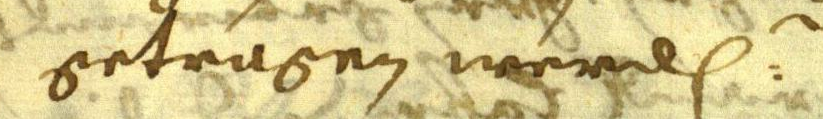getragen werd:
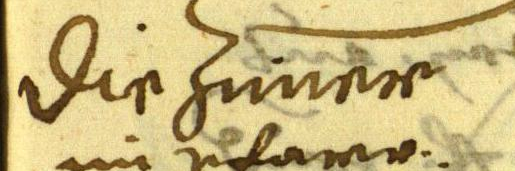Die Zimer
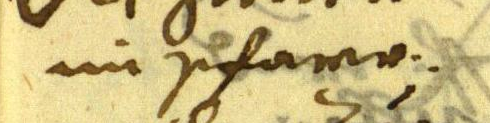im pfarr¬
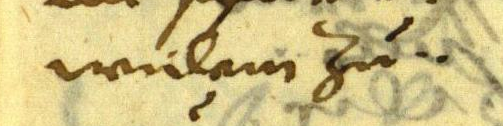widem Zū¬
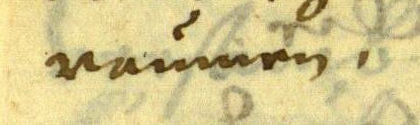raūmen.
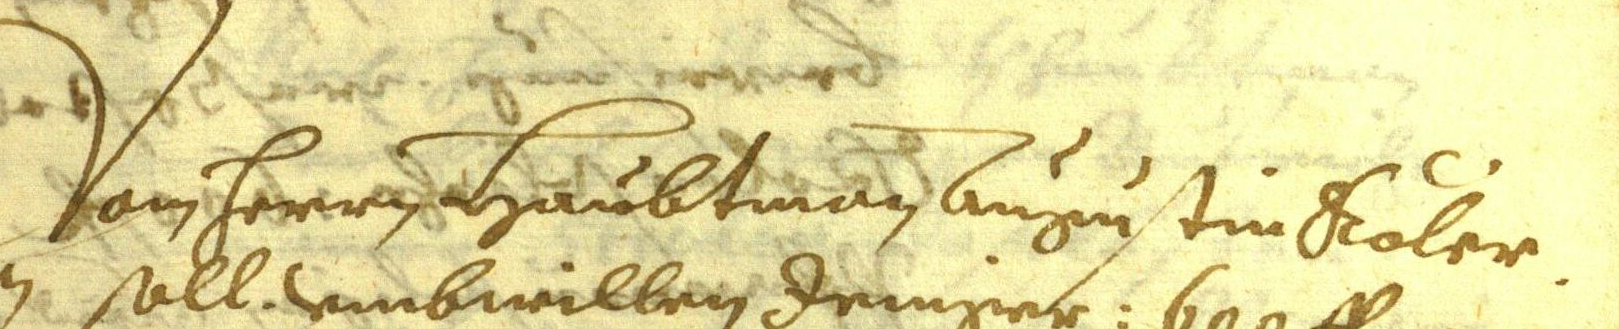Vom herrn Haūbtman Aūgūstin Kōler
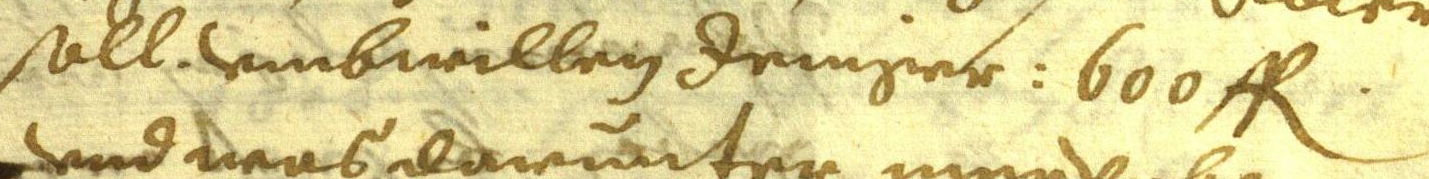soll. vmbwillen Jeniger: 600 fl.
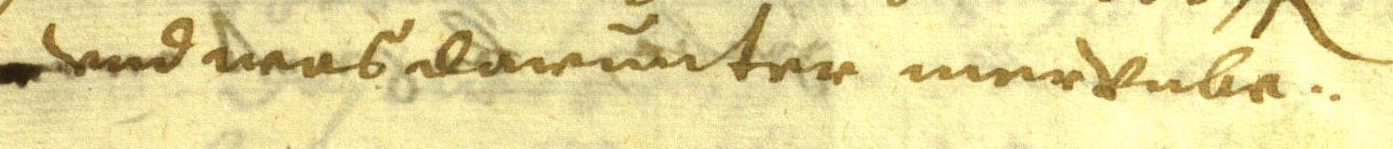vnd was darūnter mer vnbe¬
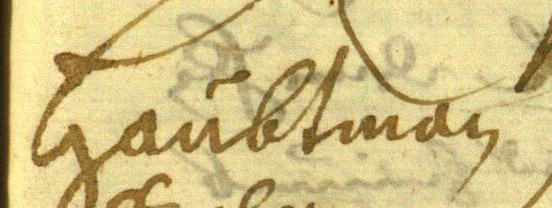Haūbtman
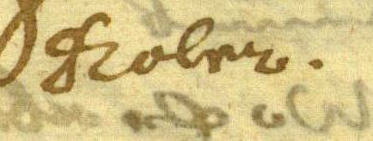Koler.
